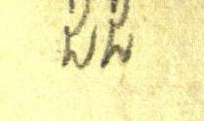22
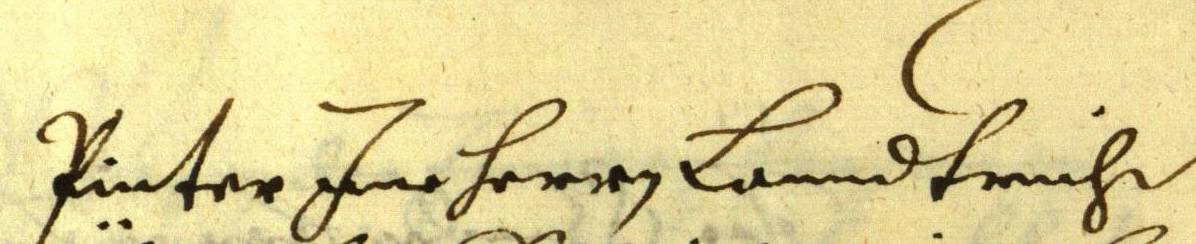Pinter Ime herrn Lanndtricht
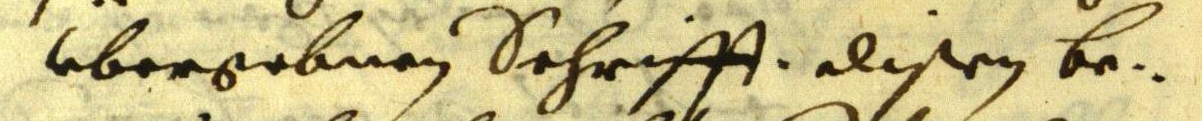v̈bergebnen Schrifft. disen be¬
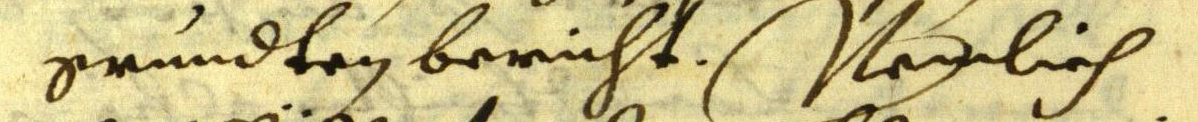grūndten bericht. Nemblich
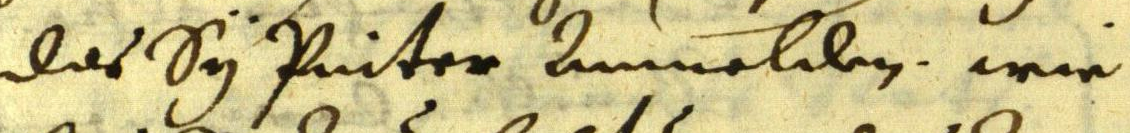das Sÿ Pinter Anmelden. wie
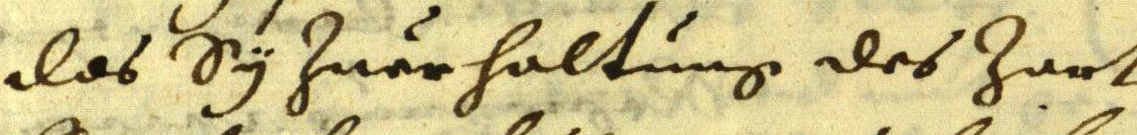das Sÿ Zūerhaltūng des Zart
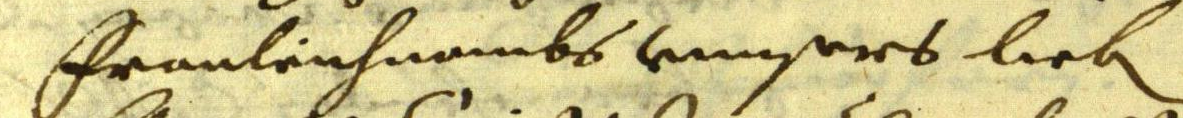Fronleichnambs vnnsers lieb
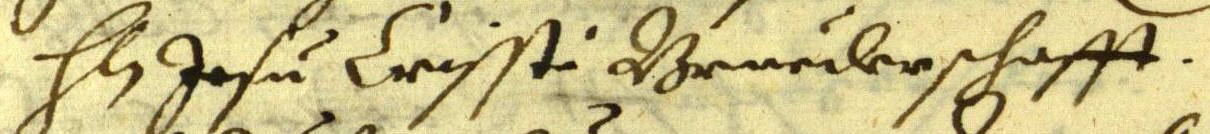H Jesū Crissti Brūederschafft.
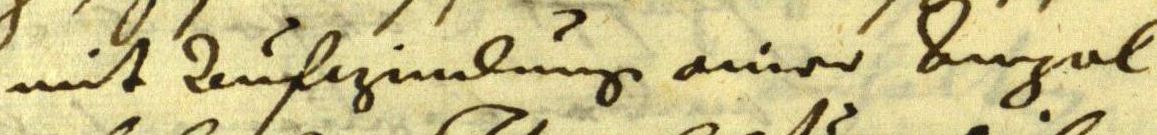mit Aūfzindūng ainer Anzal
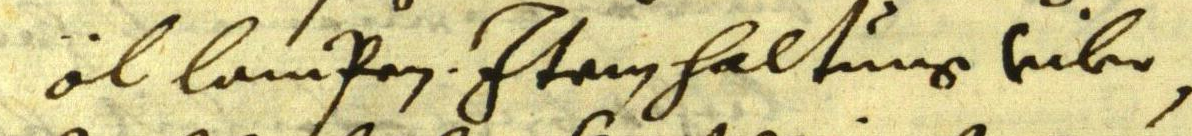öl lampen. Item haltūng viler
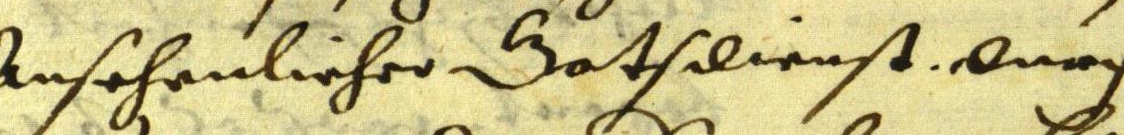Ansehenlicher Gotsdienst. dūrch
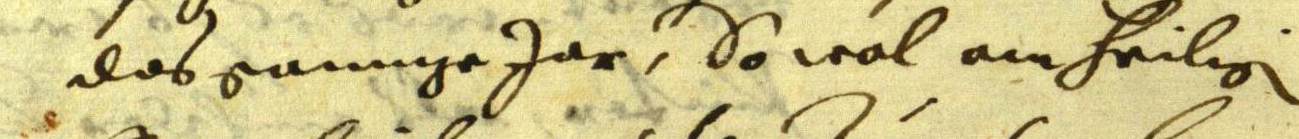das gannze Jar, So wol am heilig
